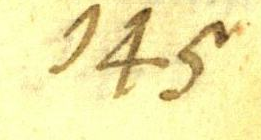145
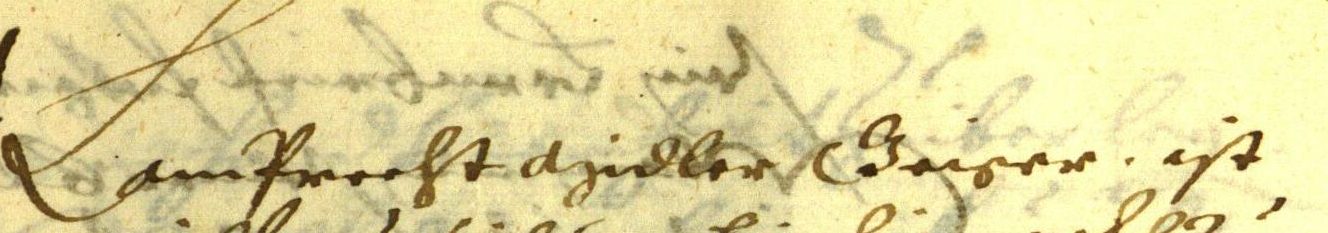LamPrecht Midler Geiger. ist
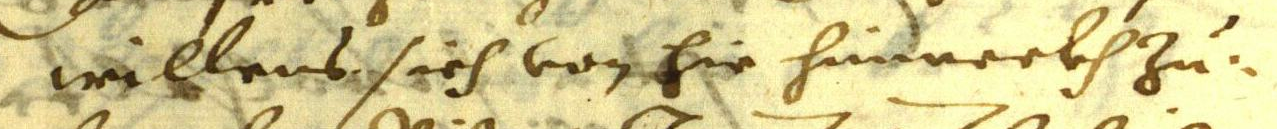willens. sich von hie hinweckh Zū¬
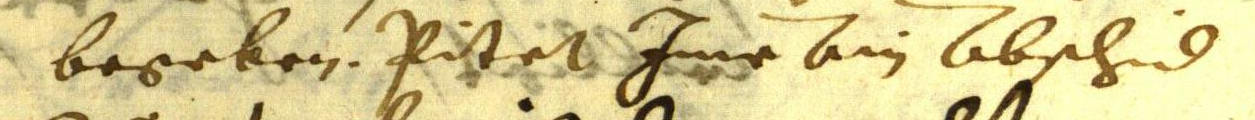begeben. Pitet Ime Ain Abschid
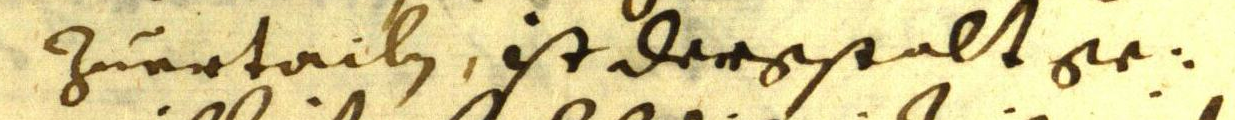Zūertailn, ist dergstalt ge¬
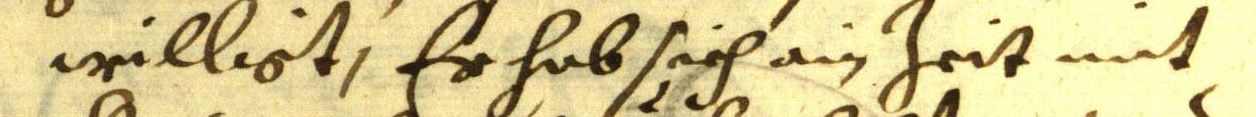willigt, Er hab sich ain Zeit mit
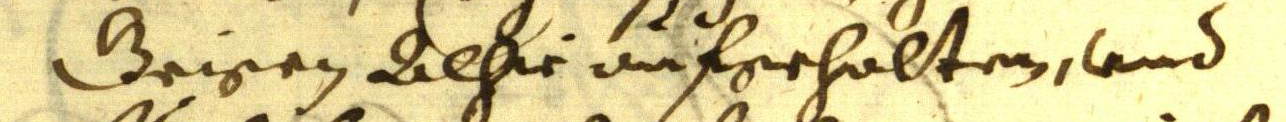Geigen Alhie aūfgehalten, vnd
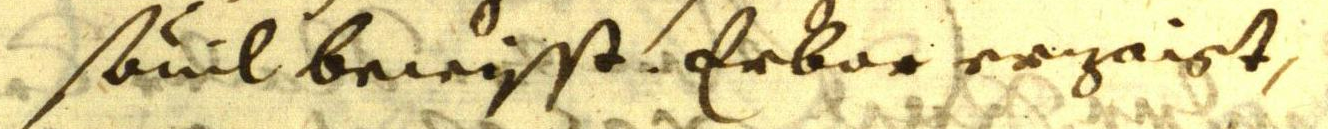soūil bewisst. Erbar ertzaigt,
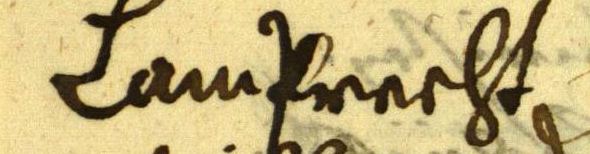LamPrecht
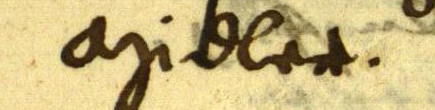Midler.
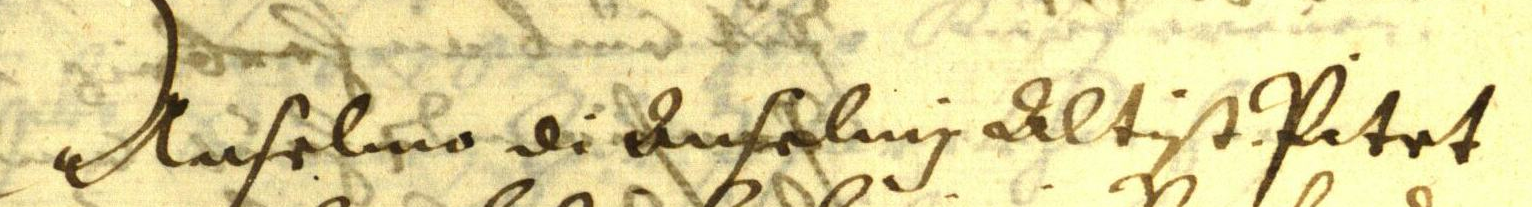Anselmo di Anselmj Altist. Pitet
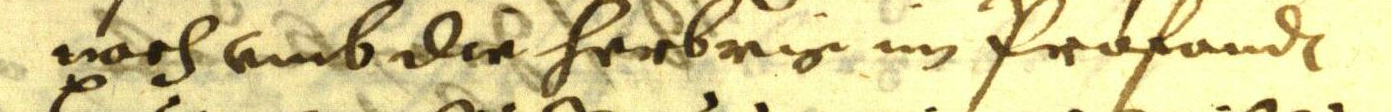noch vmb die herbrig im Profandt
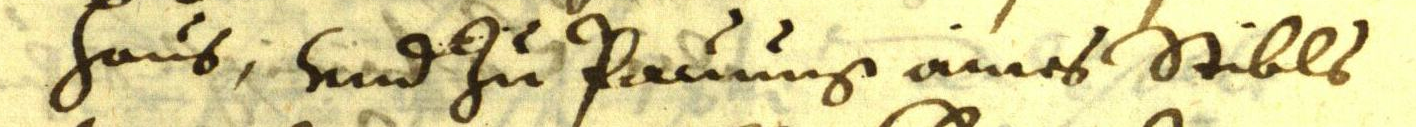haūs, vnd Zū Paūūng aines Stibls
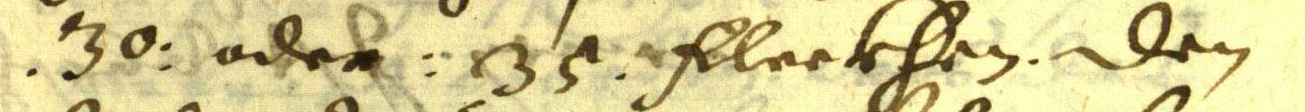.30: oder: 35. fleckhen. den
